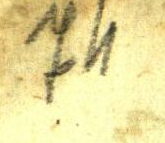74
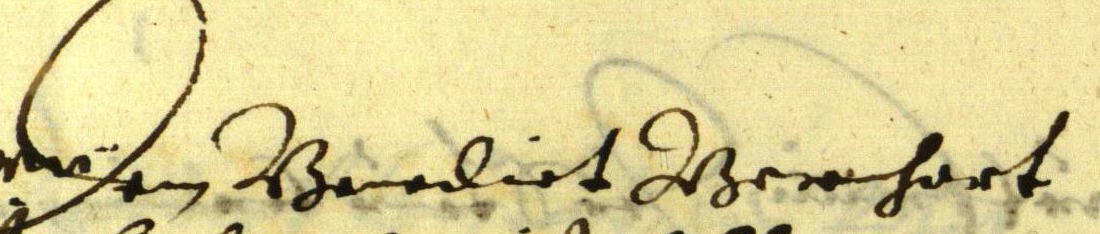Dem Benedict Bernhart
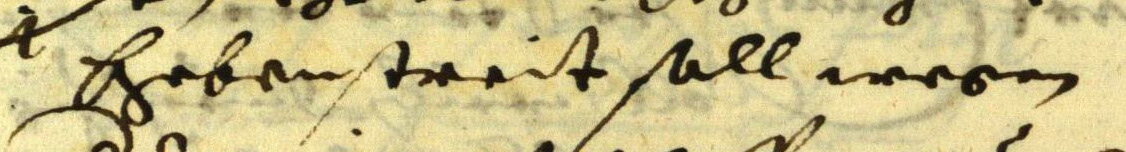Hebenstreit soll wegen
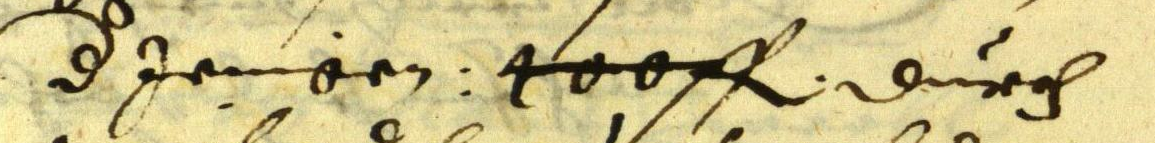d Jenigen: 400 fl. dūrch
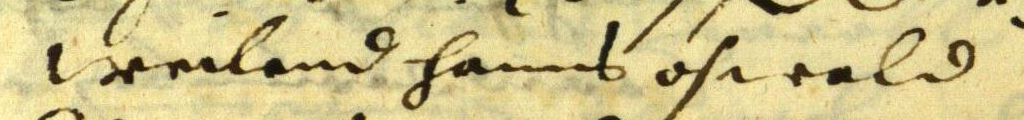weilend hanns oswald
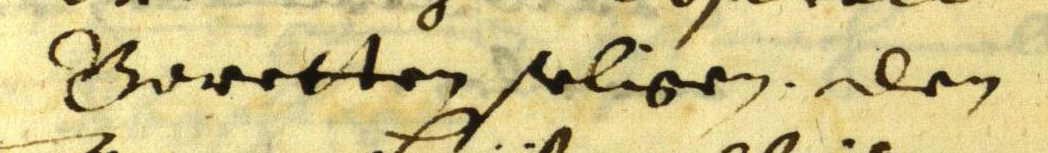Goretten seligen. den
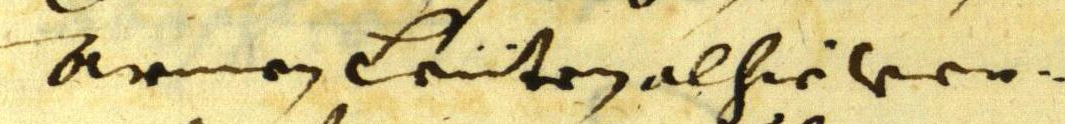Armen Leüten alhie ver¬
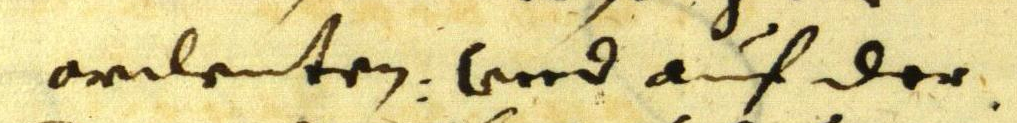ordenten: vnd aūf der
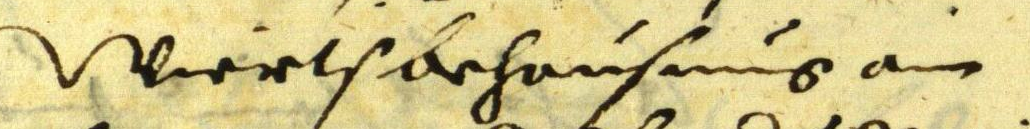Wiertsbehaūsūng am
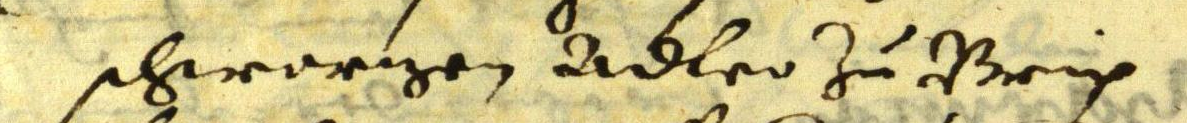schwartzen Adler Zū Brix
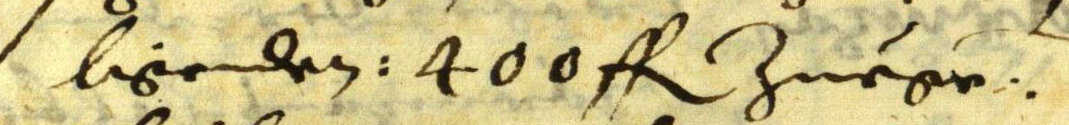ligenden: 400 fl Zūege¬
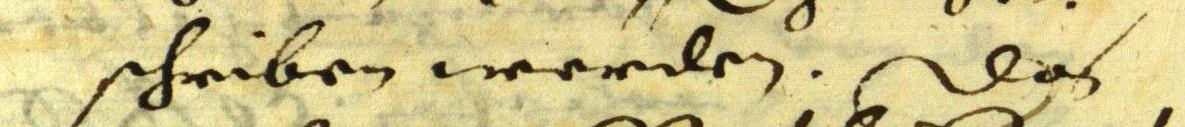schriben werden. Das
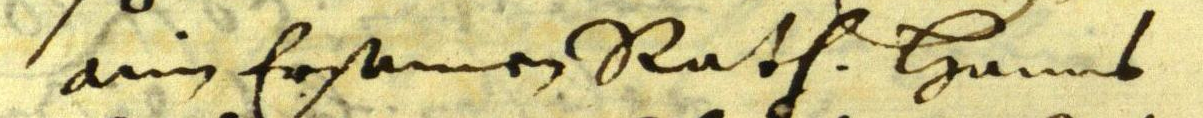aim Ersamen Rath. Hanns
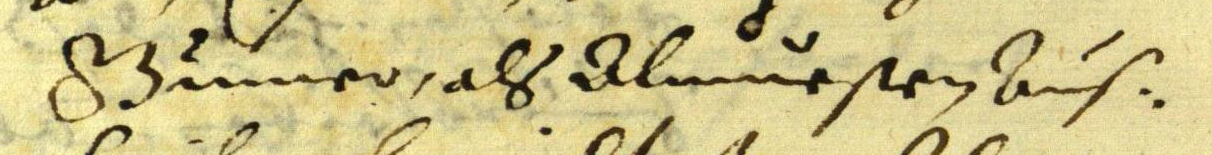Gūmer, als Almūesen Aūs¬
